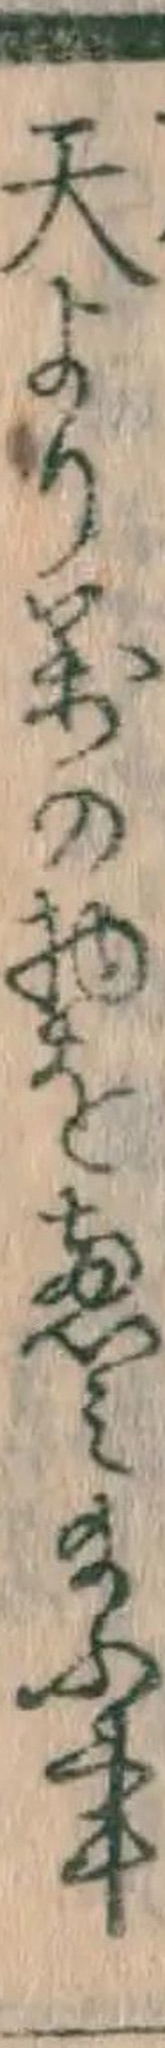天より万の物を恵み給ふ事
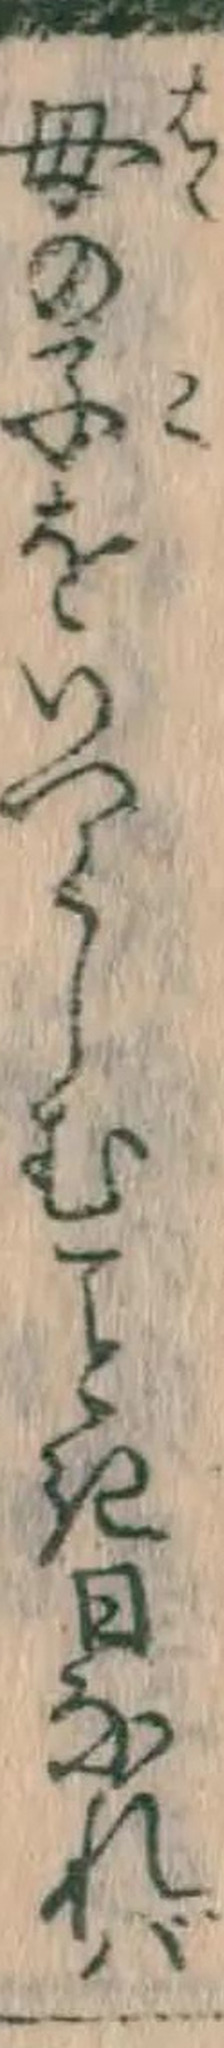母の子をいつくしむことき日なれば
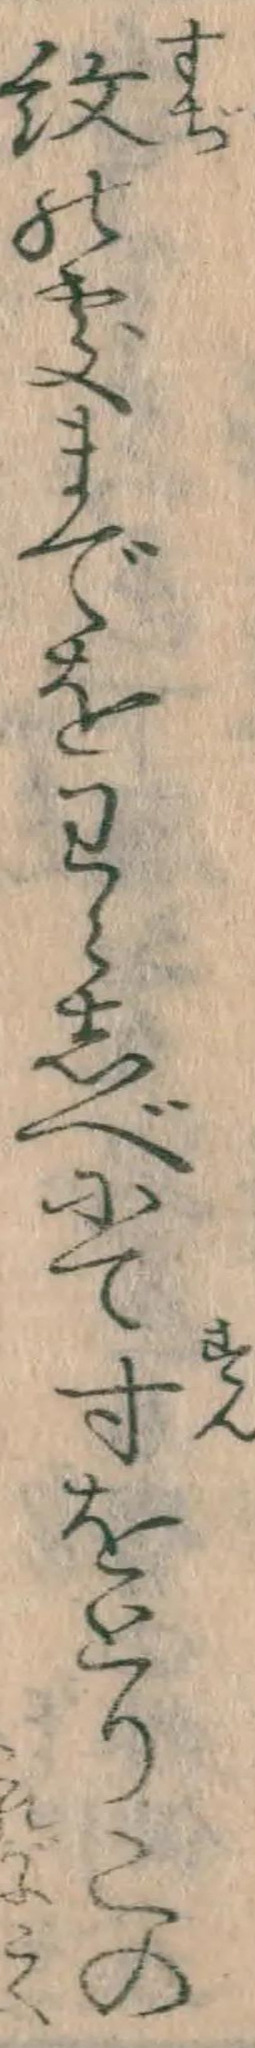紋の処までをわらしべにて寸をとりこの
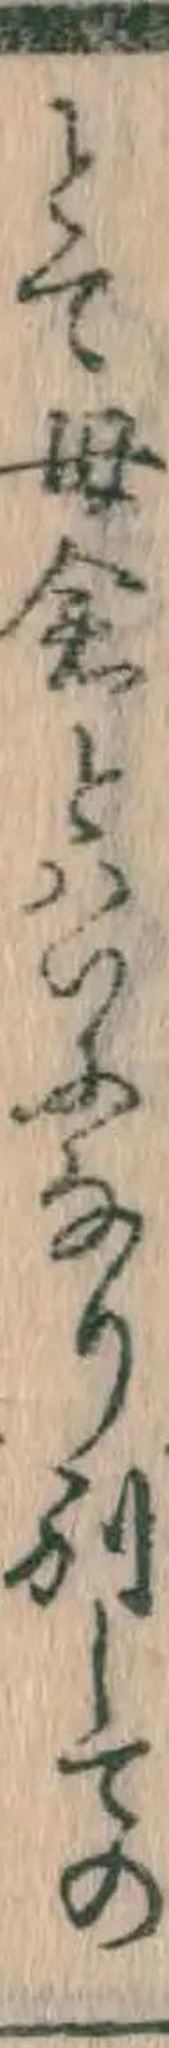とて母倉とはいふなり別しての
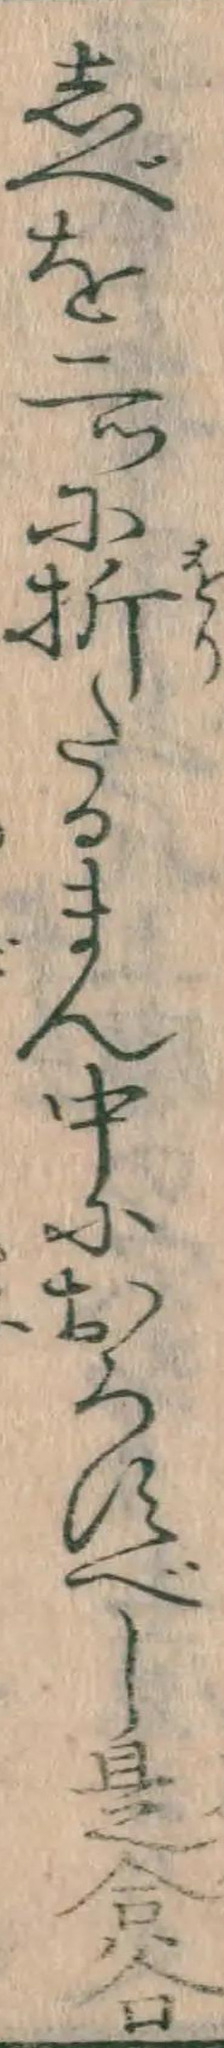しべを二ッに折たるまん中におろすべし是合谷
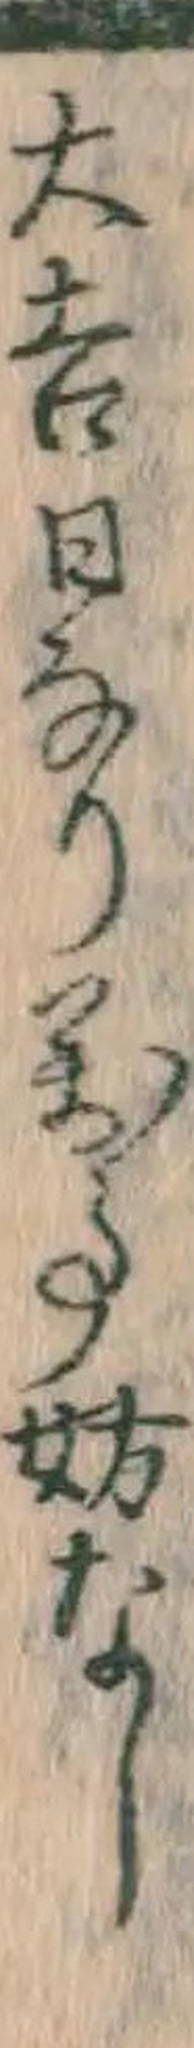大吉日なり万事妨なし
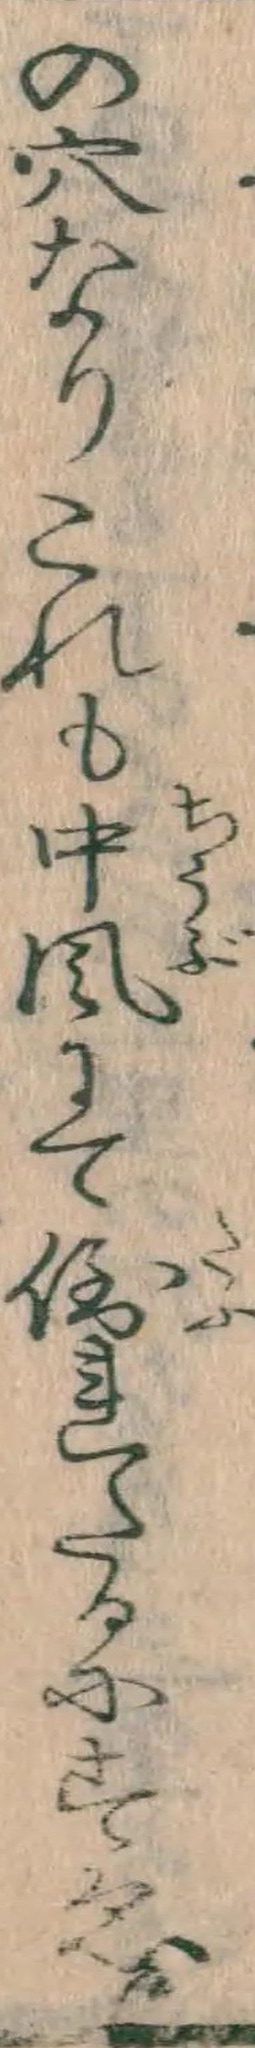の穴なりこれも中風にて倒れたるにすゑ
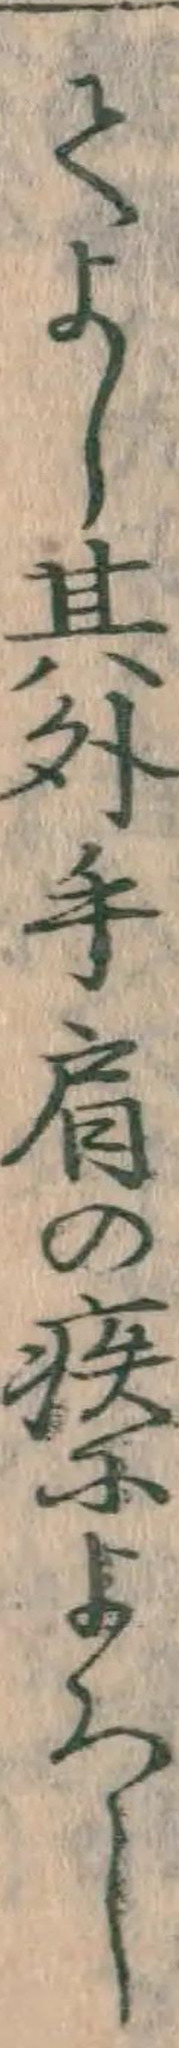てよし其外手肩の疾によろし
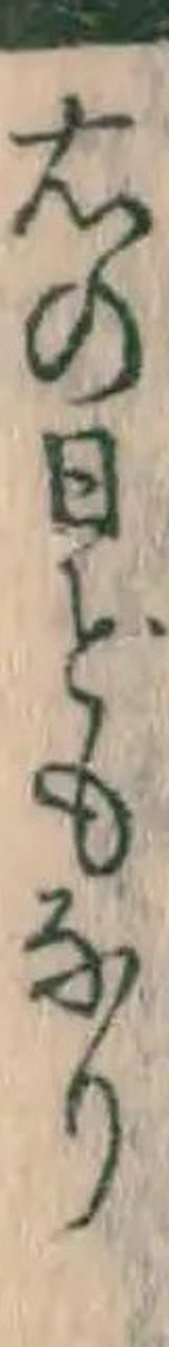右の日どもなり
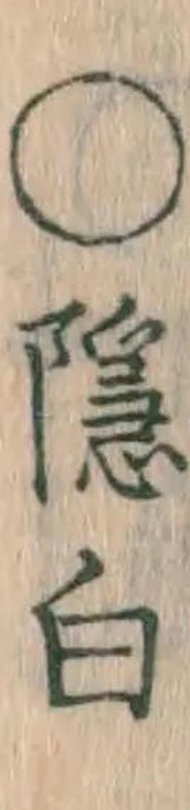○隠白
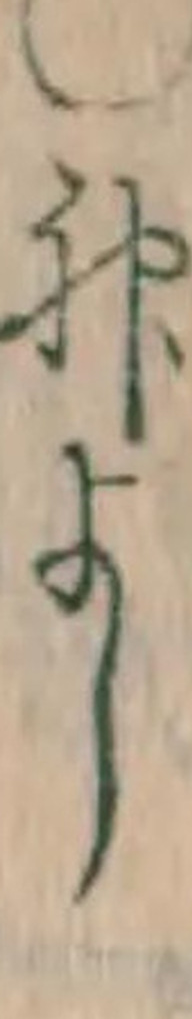○神よし
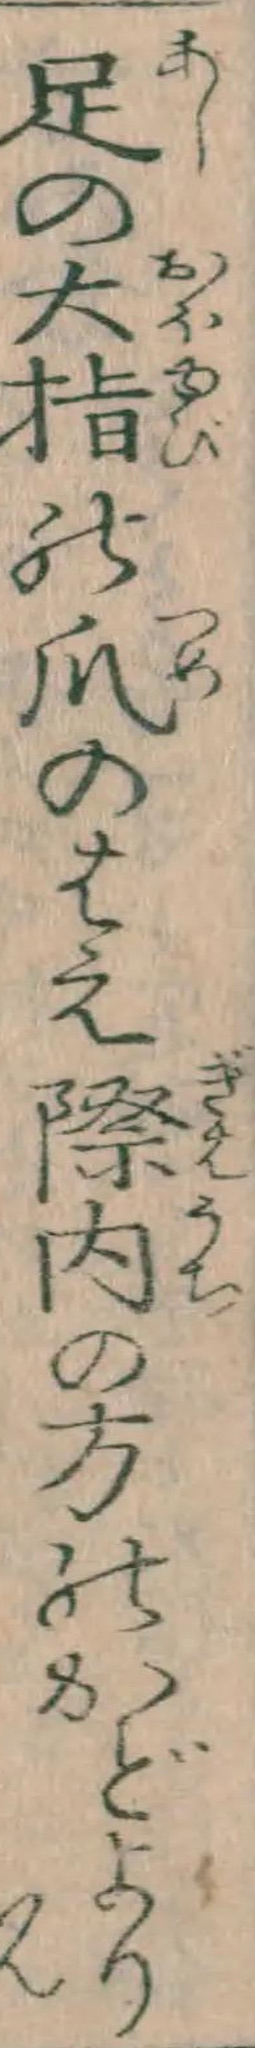足の大指の爪のはえ際内の方のかどより
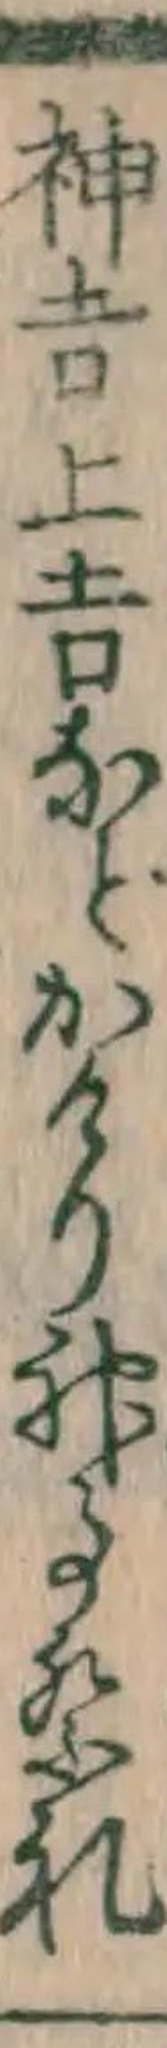神吉上吉などかけり神事祭礼
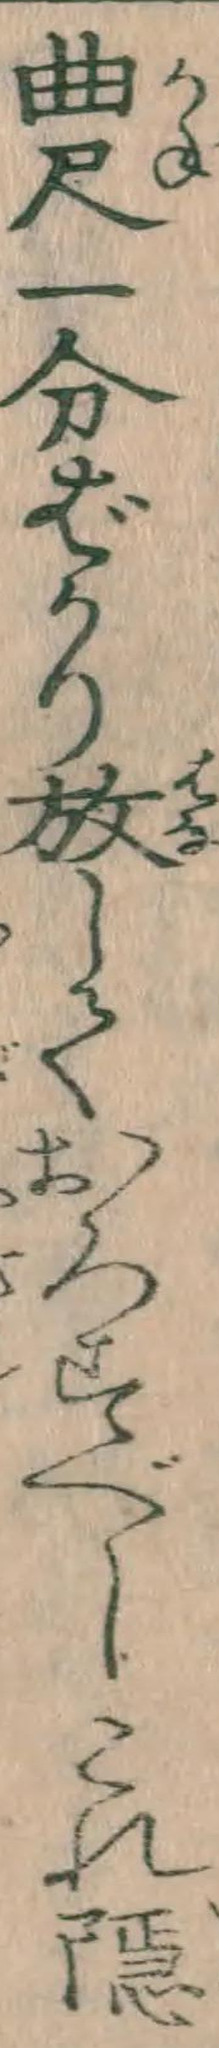曲尺の一分ばかり放しておろすべしこれ隠
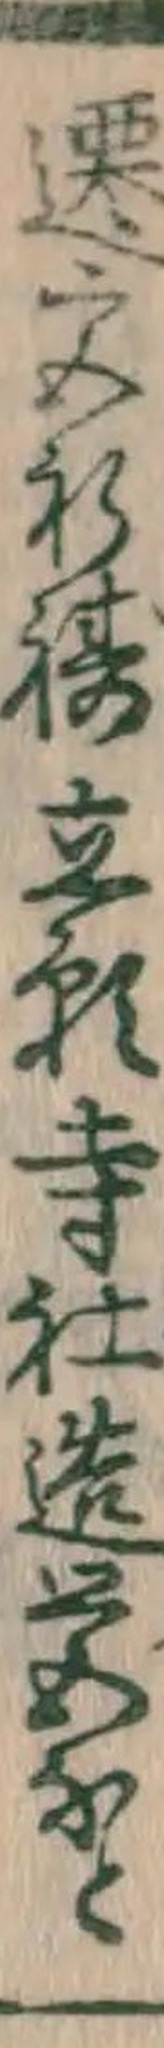遷宮祈祷立願寺社造営なと
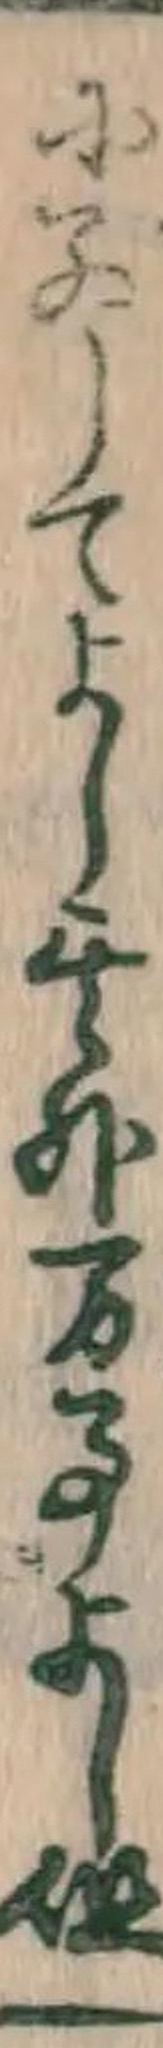に別してよし其外万事よし但
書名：広益秘事大全 3巻. [4]
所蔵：国立国会図書館 National Diet Library, JAPAN
